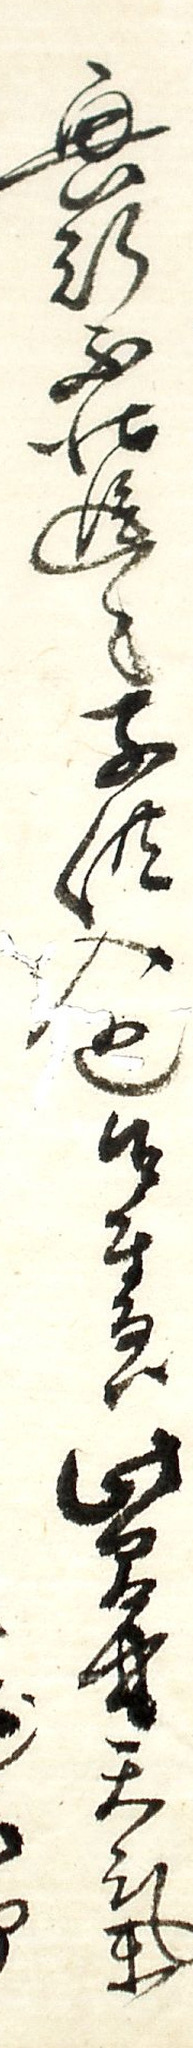興行不仕追々子供入込候ニ付而ハ此間中天気
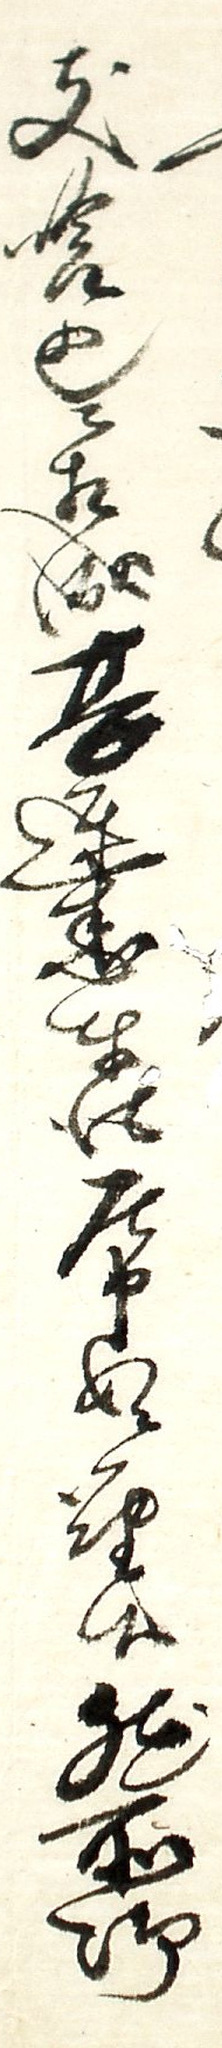支喰込ニ相成甚迷惑奉仕居申義ニ御座候然所御
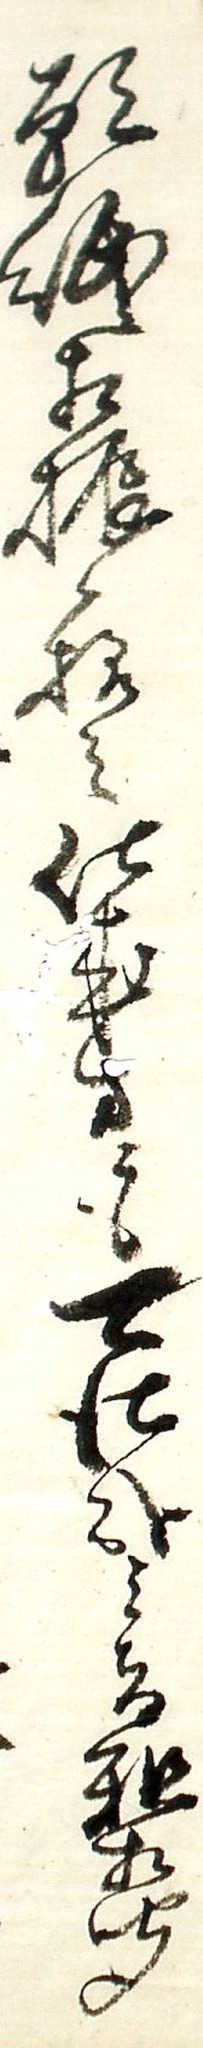願紙相振候様之仕成方ニも可仕哉之旨粗相聞
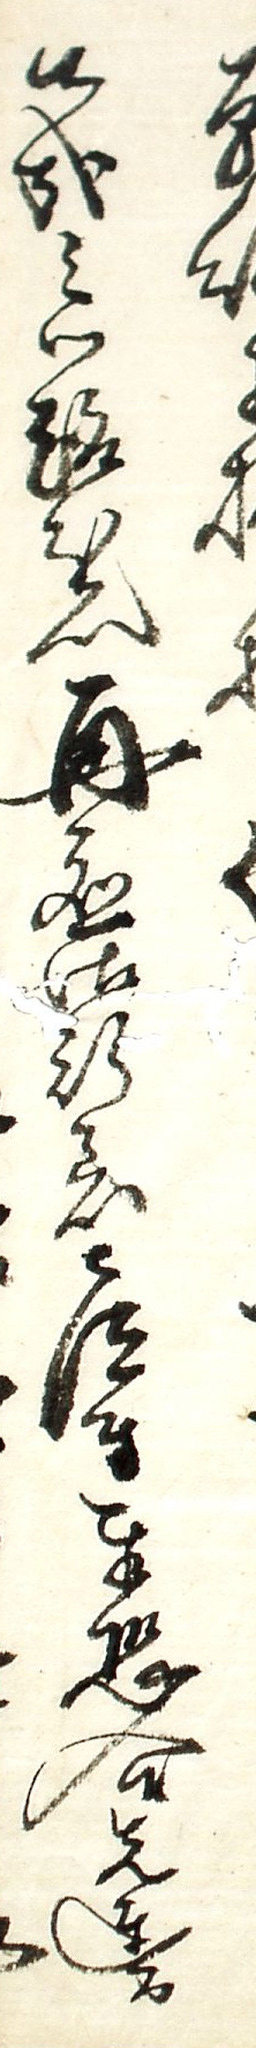候哉之御趣を以再應御行着被仰付奉恐入候先達而
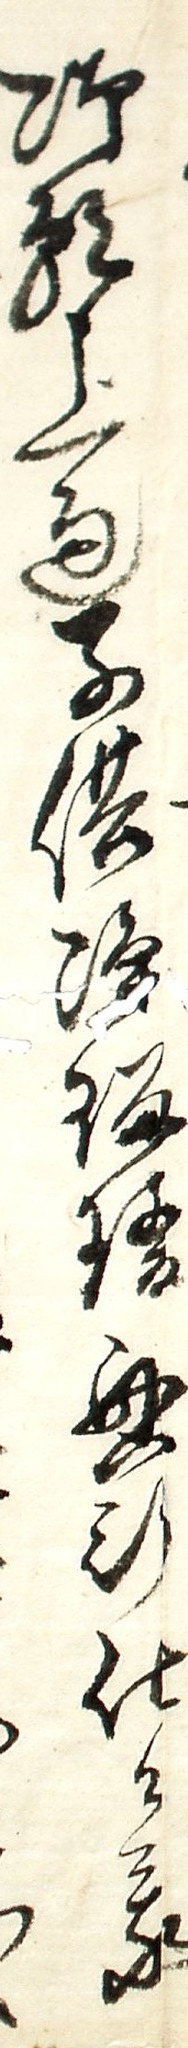御願申上通子供浄瑠璃興行仕候義
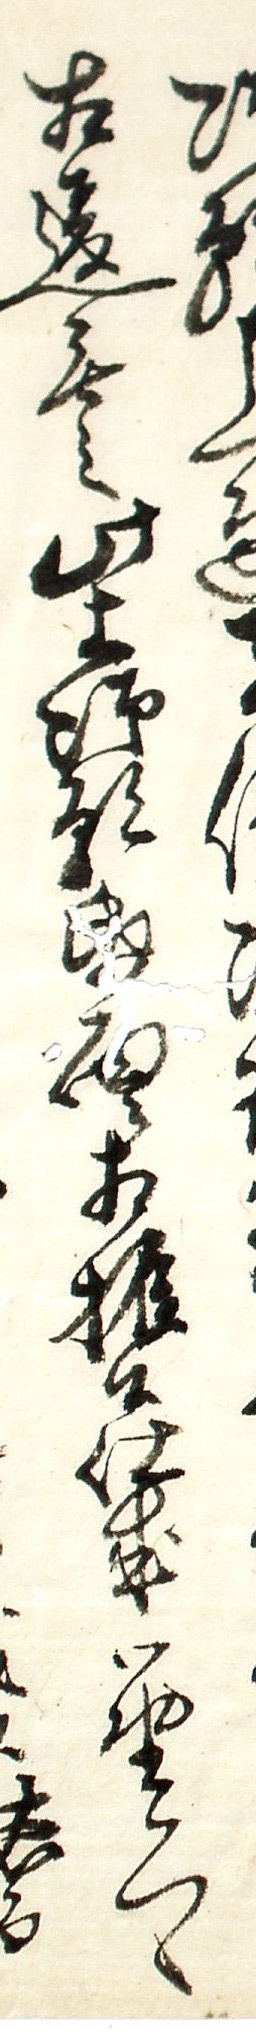相違無之此上御願帋面ニ相振候仕成御座候ハヽ
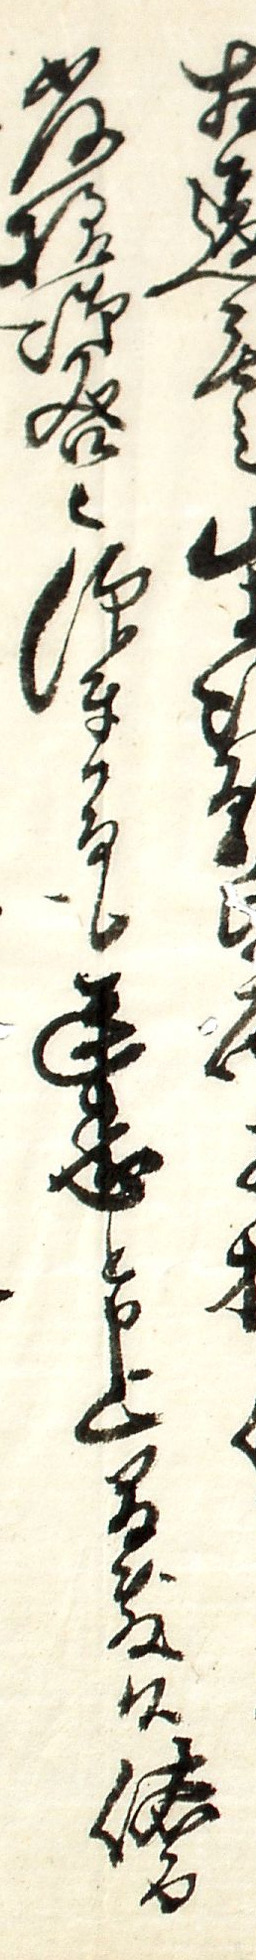如何様御咎被仰付候而も迷惑と申上間敷候依而
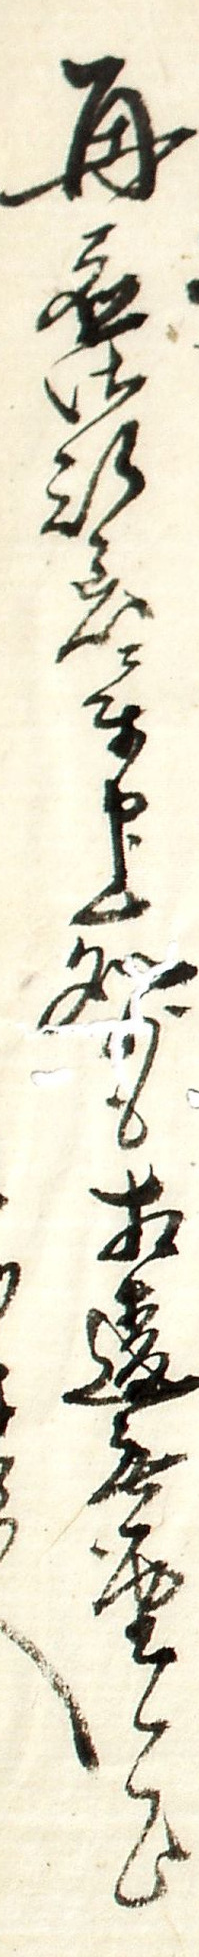再應御行着ニ奉申上処少も相違無御座候以上
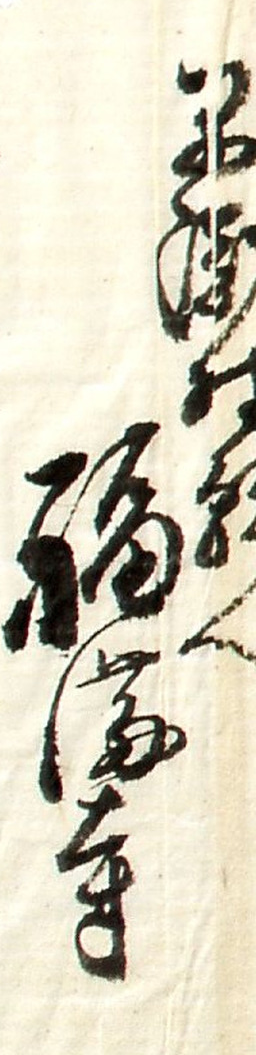福満寺
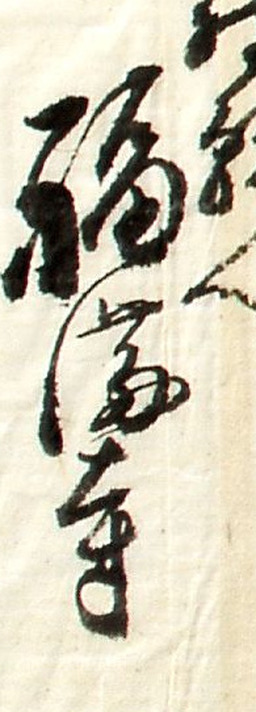福満寺
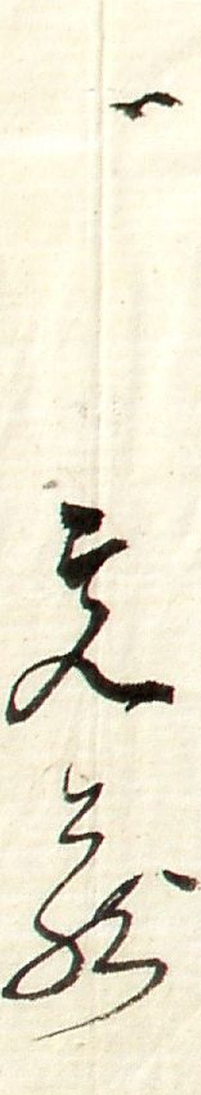同文蔵

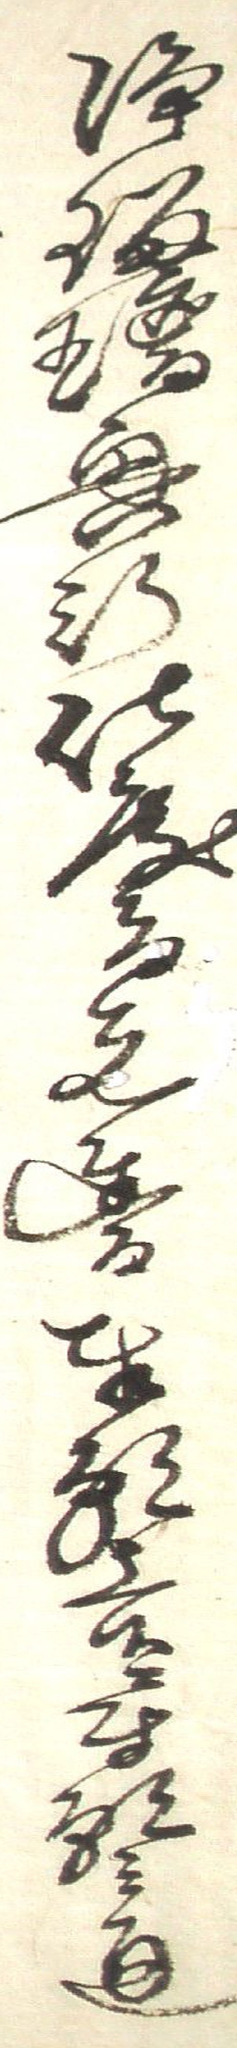浄瑠璃興行仕度旨先達而奉願上候ニ付願之通
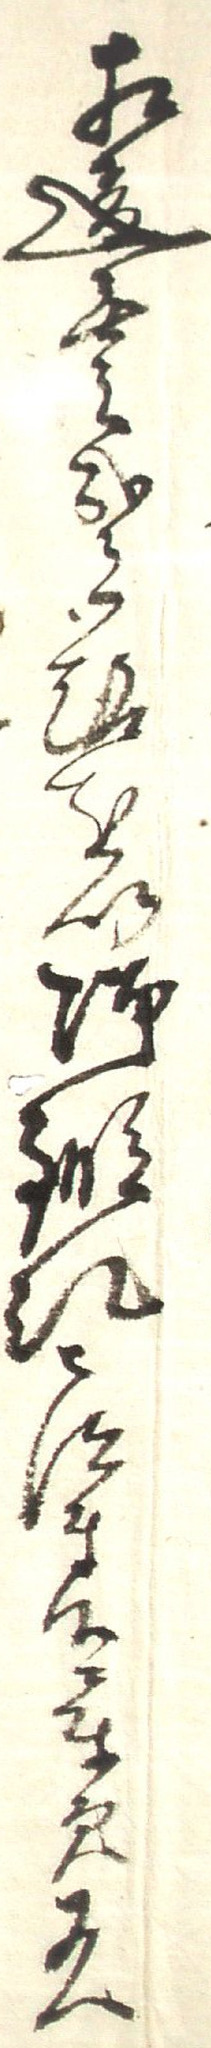相違無之哉之御趣を以御鍛糺被仰付候ニ付而ハ右
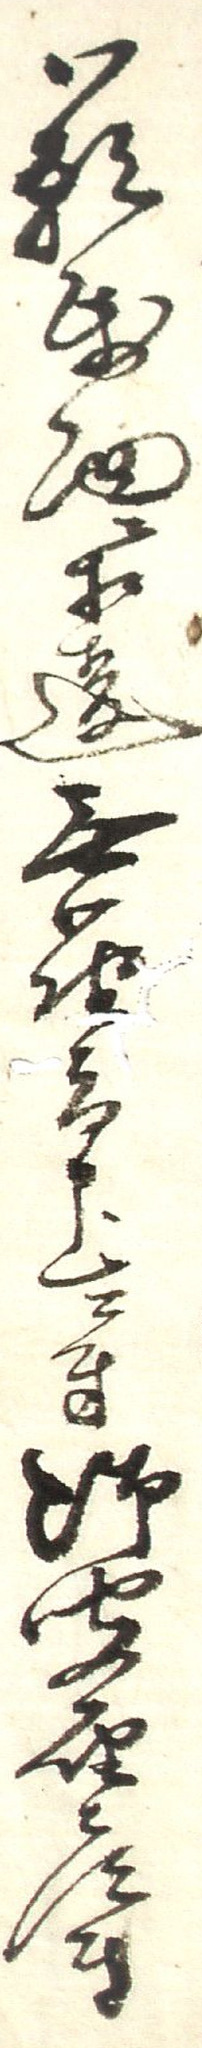御願帋面ニ相違無御座旨申上ニ付御聞届被仰付
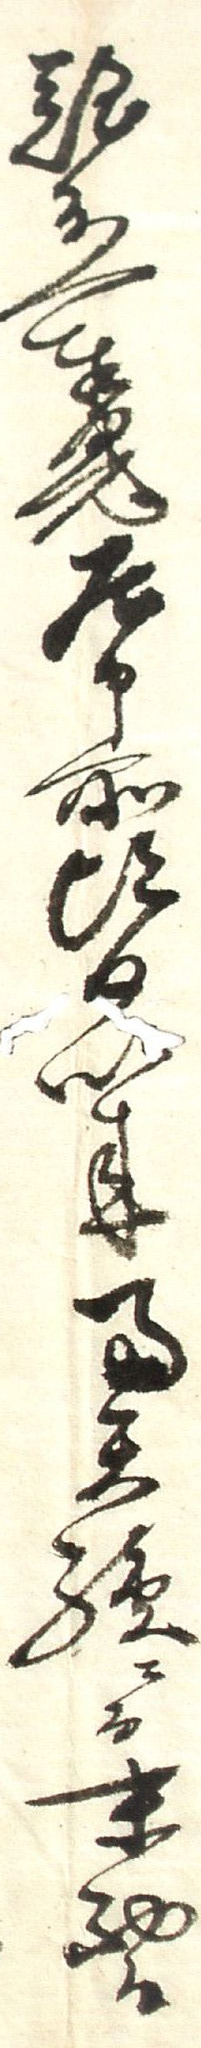難有奉畏居申所頃日以来雨天續ニ而未初而
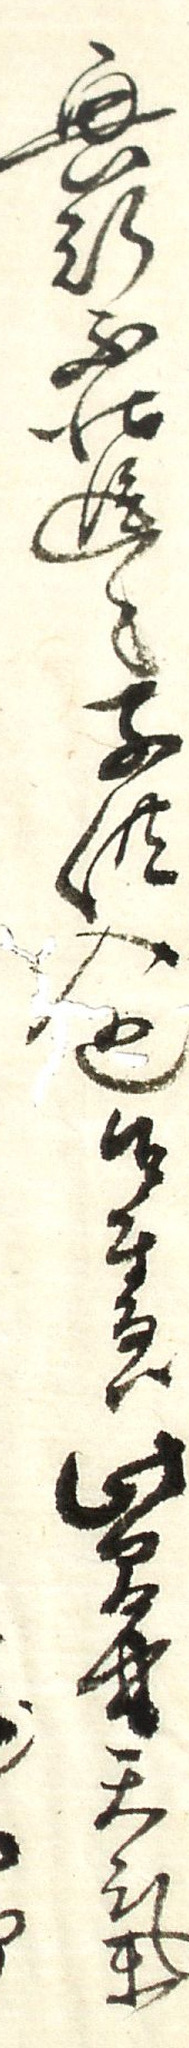興行不仕追々子供入込候付而ハ此間中天気
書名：早渕村福満寺浄瑠璃再応行着添書ひかへ
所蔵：鳴門教育大学 Naruto University of Education
